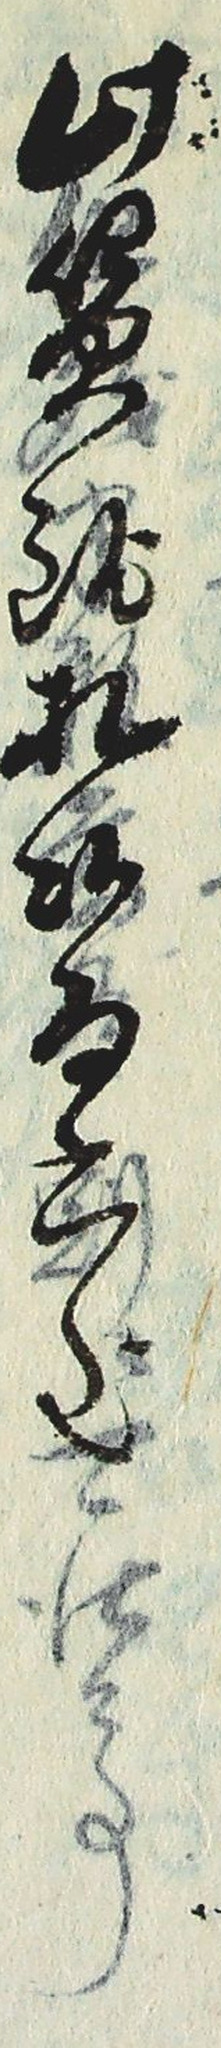此賃銀札弐百六匁
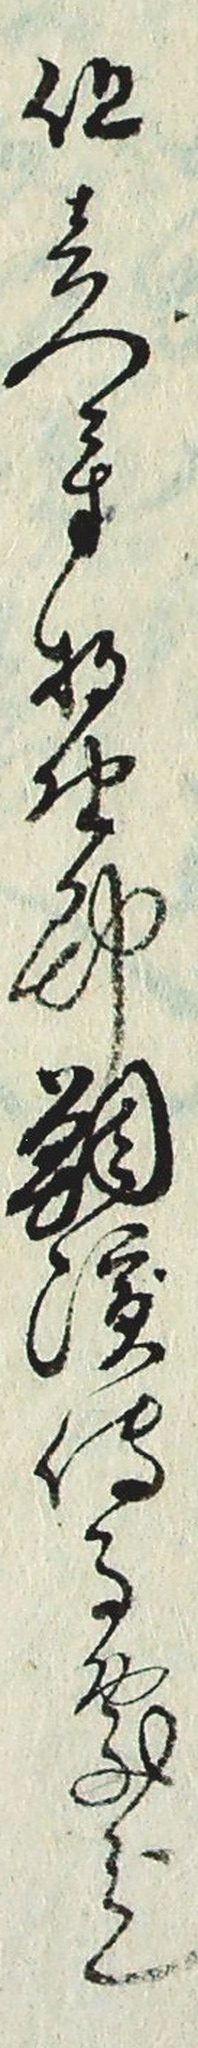但壱人に付板野郡鯛浜伝馬処迄
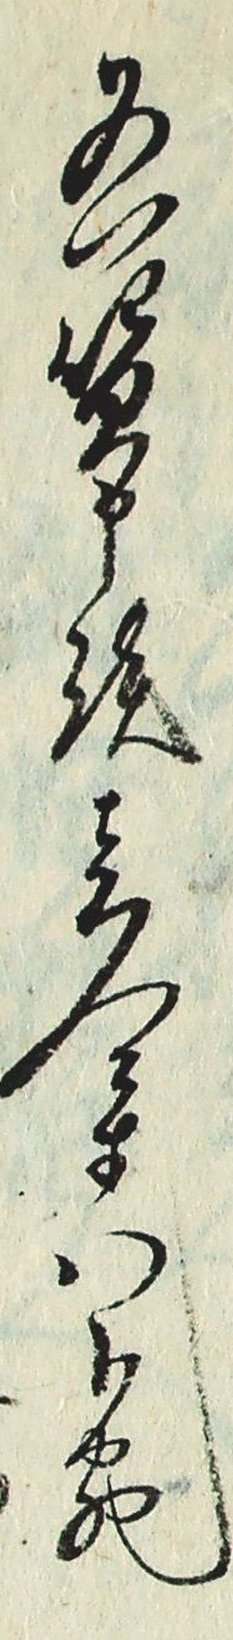右賃申談壱人に付八分宛
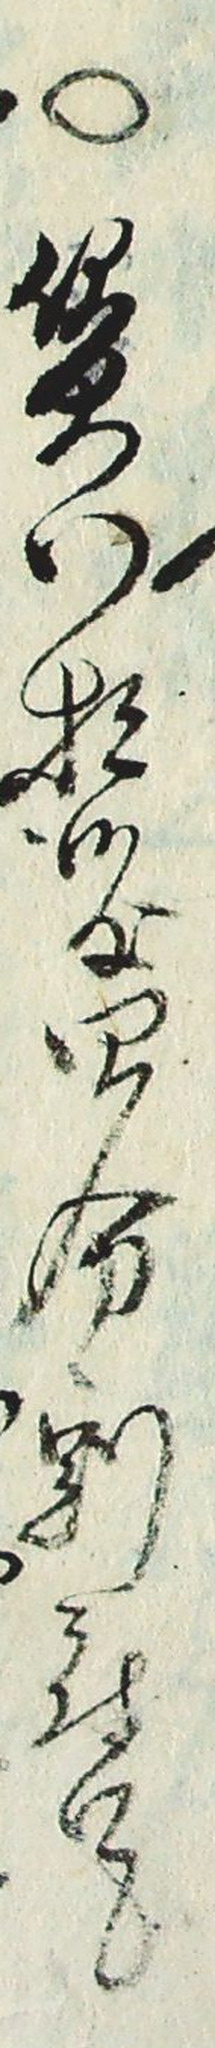賃八拾弐匁四分割苻仕候
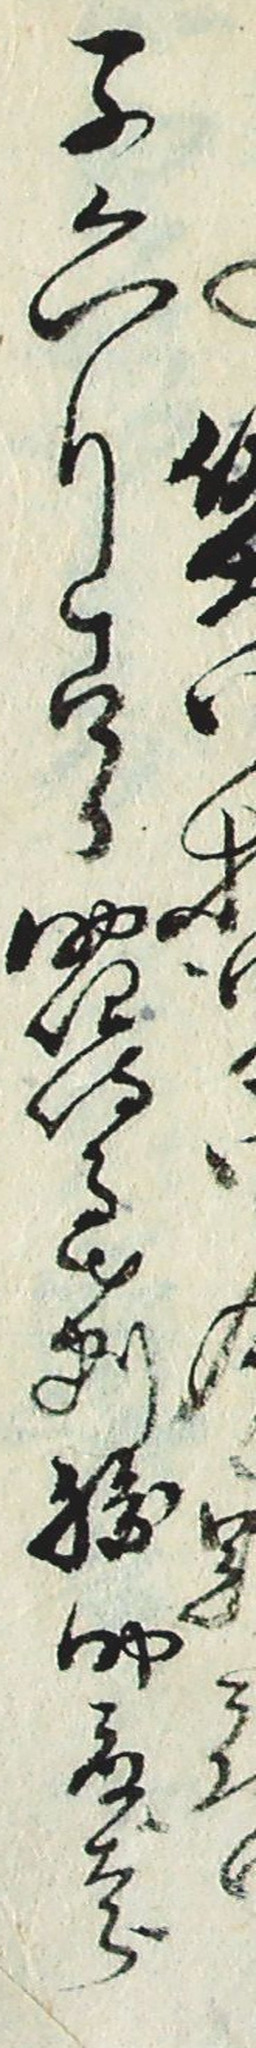子六月十四日助任伝馬才判勝助応太郎

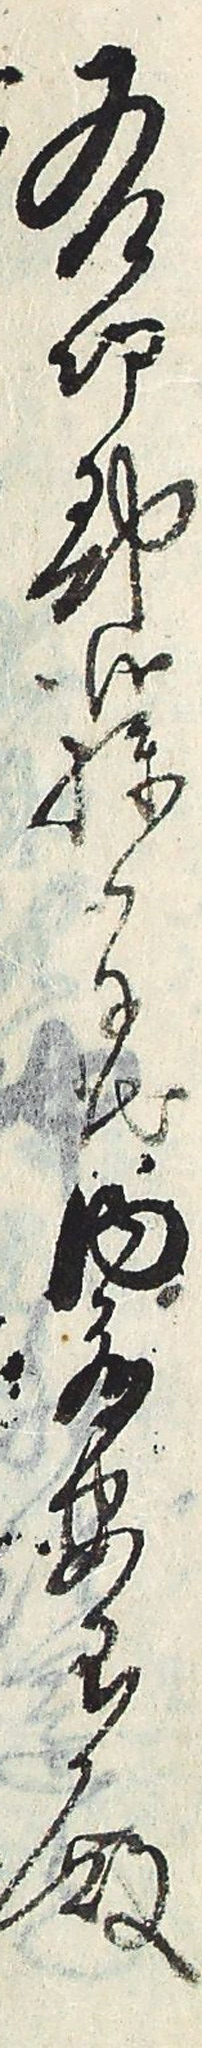右御郡代様御手代内藤安蔵殿
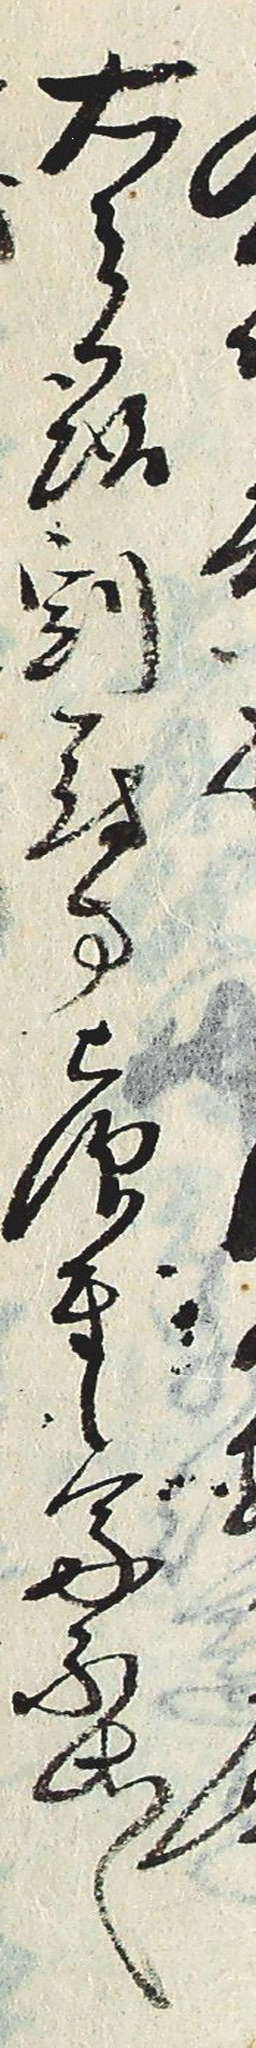右之御趣割苻方被仰付候富永氏へ
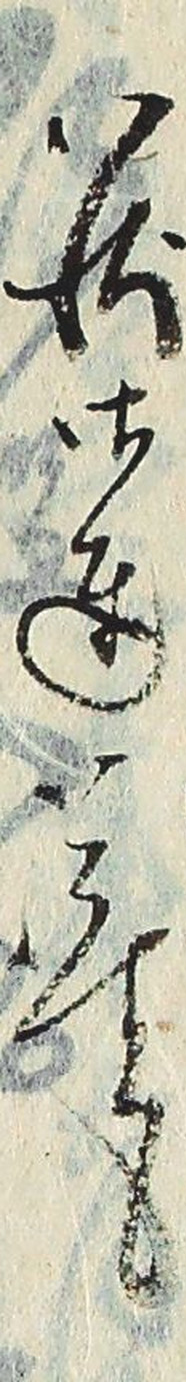御状御達御座候
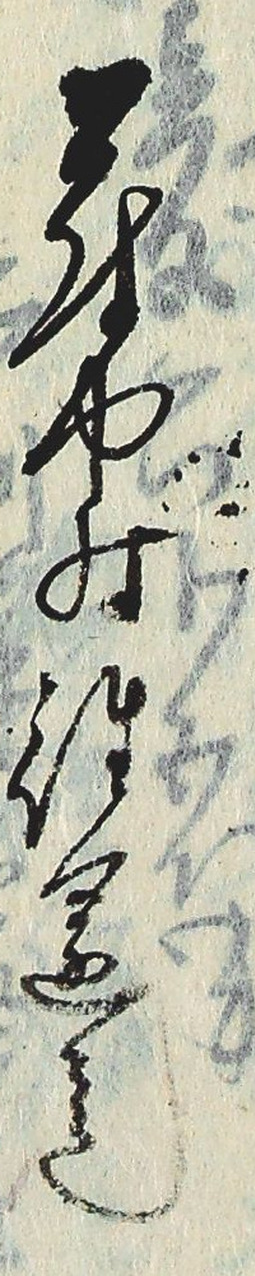府中村往還迄
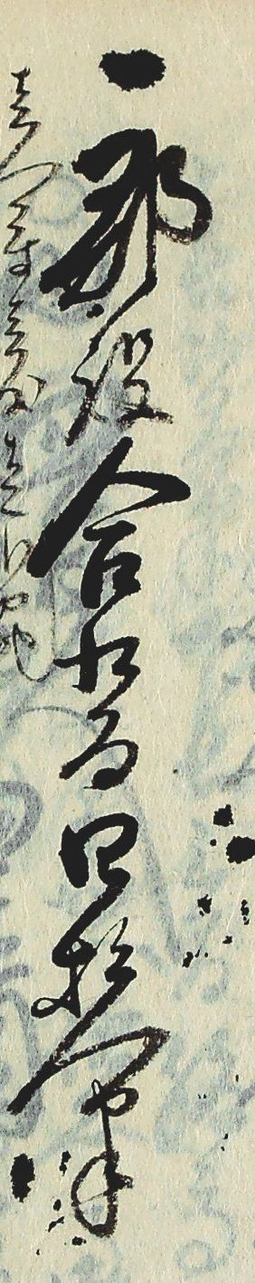一郡役合九百四拾人半
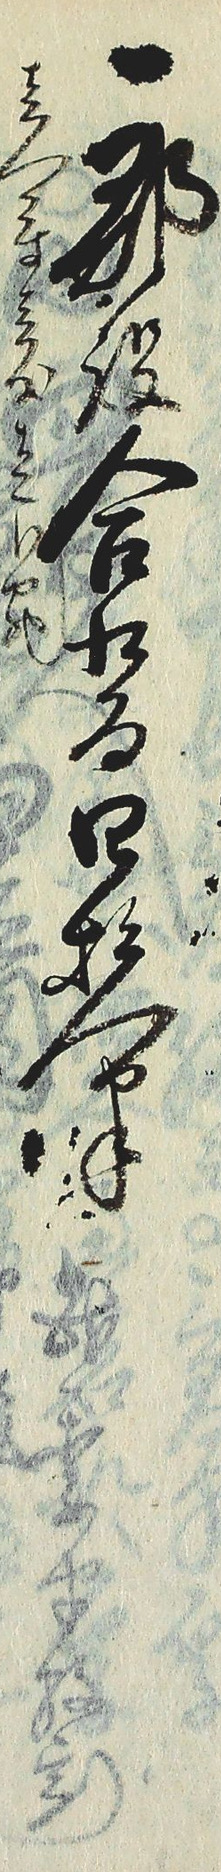一郡役合九百四拾人半
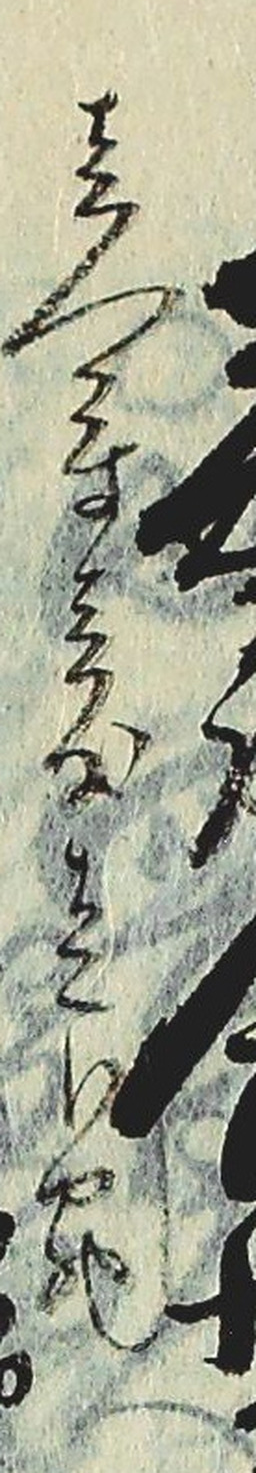壱人に付壱匁壱分宛
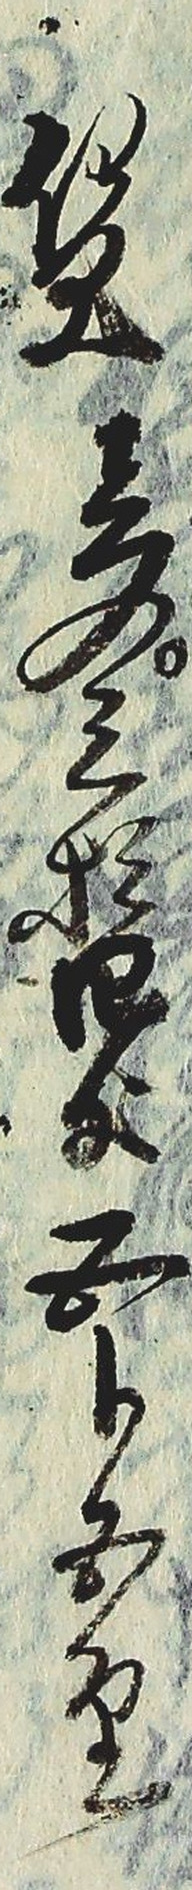賃壱〆〇三拾四匁五分五厘
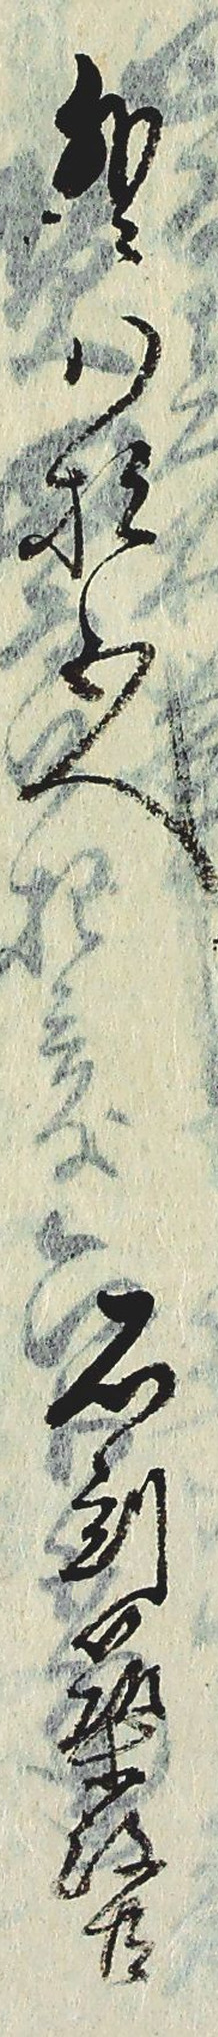外に八拾五人石割築役共
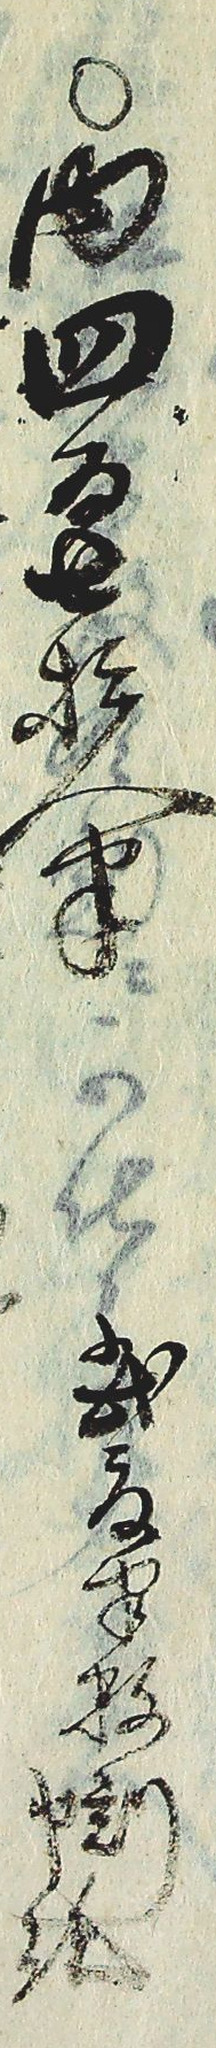内四百七拾人半当夏半数割申継
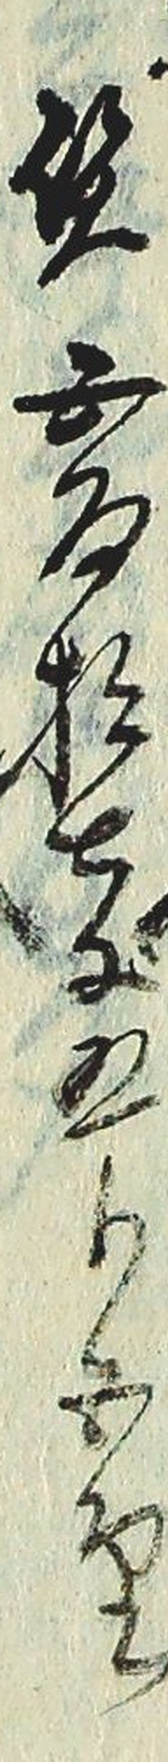賃五百拾七匁五分五厘
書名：名東郡中諸割賦元帳
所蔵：鳴門教育大学 Naruto University of Education
